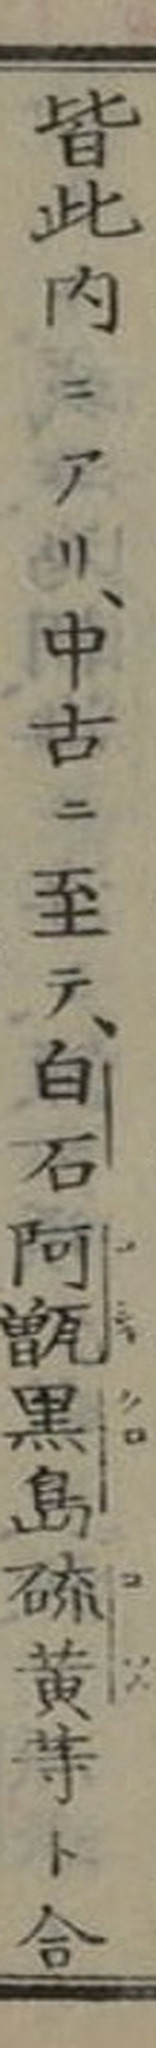皆此内ニアリ、中古ニ至テ、白石阿甑黒島硫黄等ト合
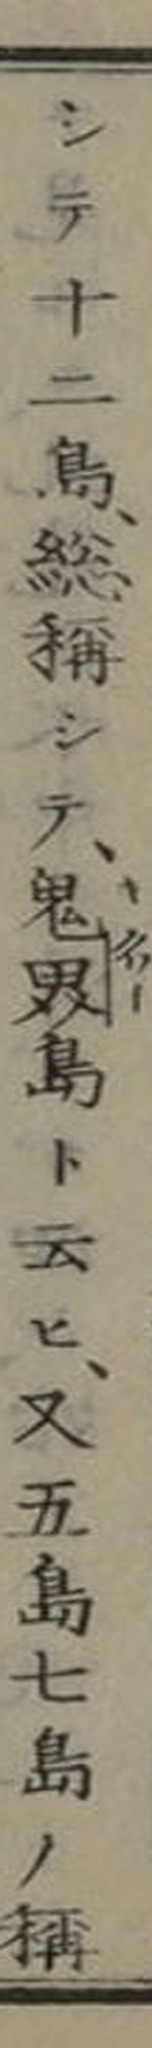シテ十二島、総称シテ、鬼界島ト云ヒ、又五島七島ノ称
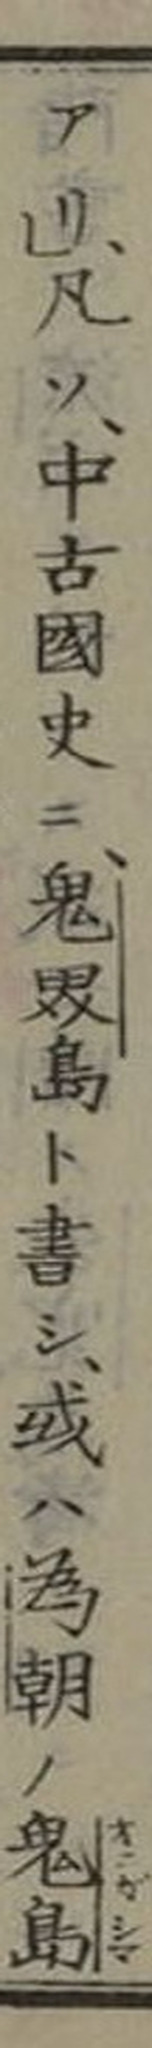アリ、」凡ソ、中古国史ニ、鬼界島ト書シ、或ハ為朝ノ鬼島
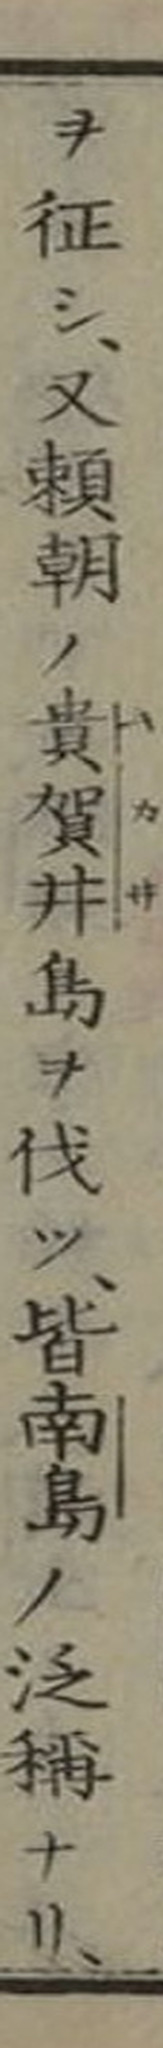ヲ征シ、又頼朝ノ貴賀井島ヲ伐ツ、皆南島ノ泛称ナリ、
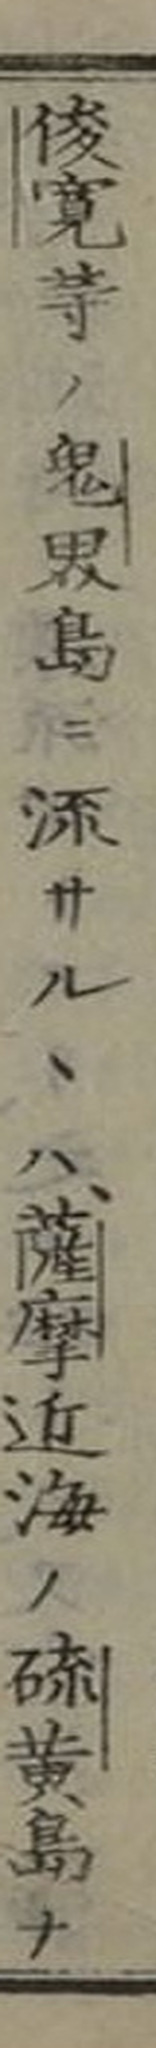俊寛等ノ鬼界島ニ流サルヽハ、薩摩近海ノ硫黄島ナ
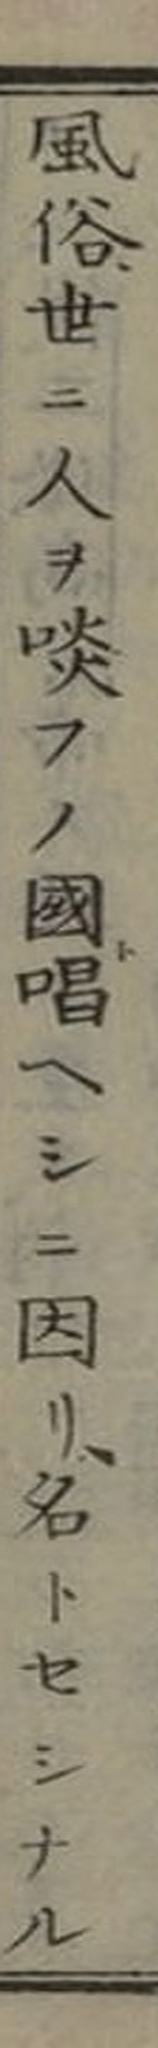風俗、世ニ人ヲ啖フノ国唱ヘシニ因リ、名トセシナル

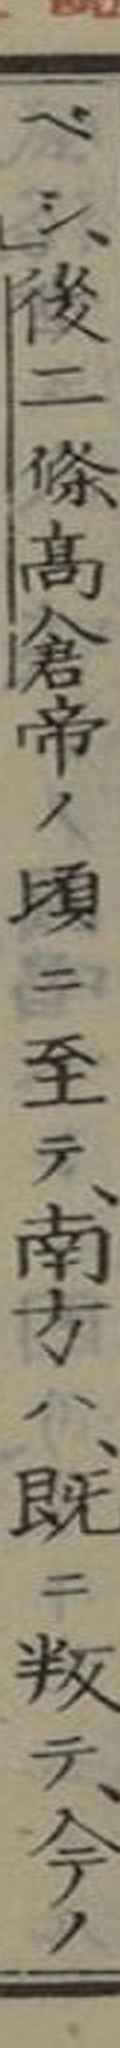ベシ、」後二条高倉帝ノ頃ニ至テ、南方ハ、既ニ叛テ、今ノ
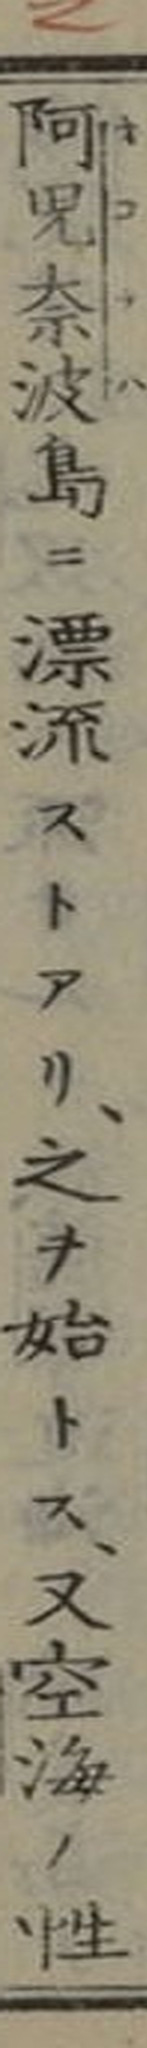阿児奈波島ニ漂流ストアリ、之ヲ始トス、又空海ノ性
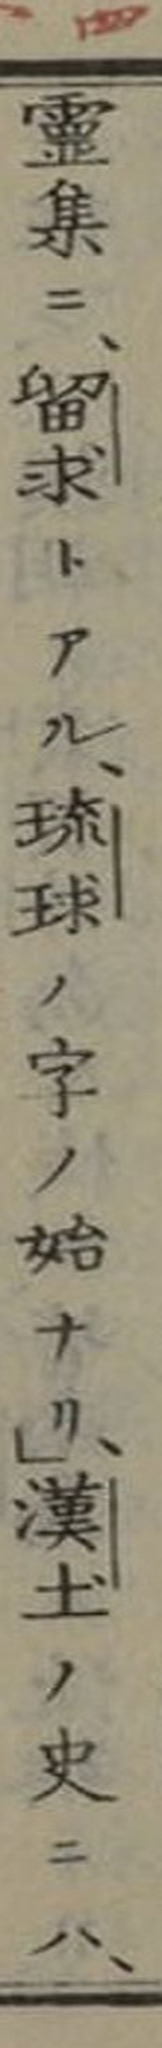霊集ニ、留求トアル、琉球ノ字ノ始ナリ、」漢土ノ史ニハ、
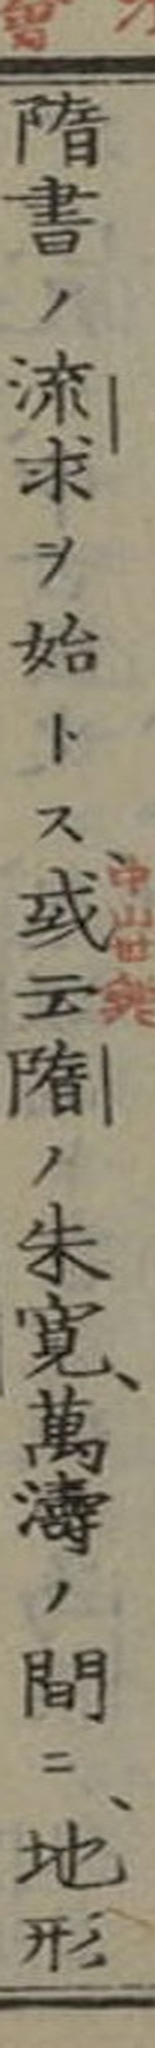隋書ノ流求ヲ始トス、或云隋ノ朱寛、万濤ノ間ニ、地形
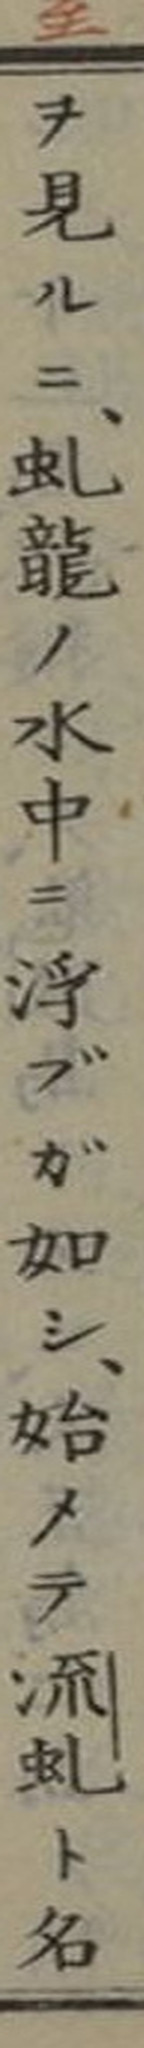ヲ見ルニ、虬竜ノ水中ニ浮ブガ如シ、始メテ流虬ト名
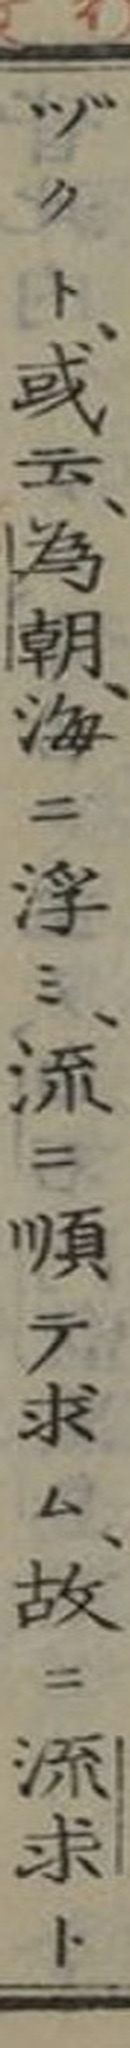ヅクト、或云、為朝、海ニ浮ミ、流ニ順テ求ム、故ニ流求ト
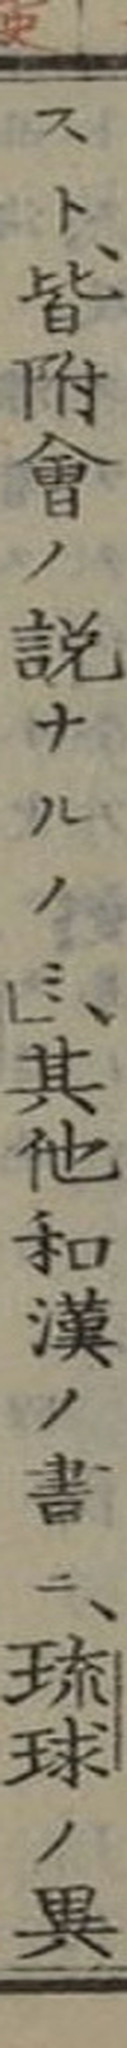スト、皆附会ノ説ナルノミ、」其他和漢ノ書ニ、琉球ノ異
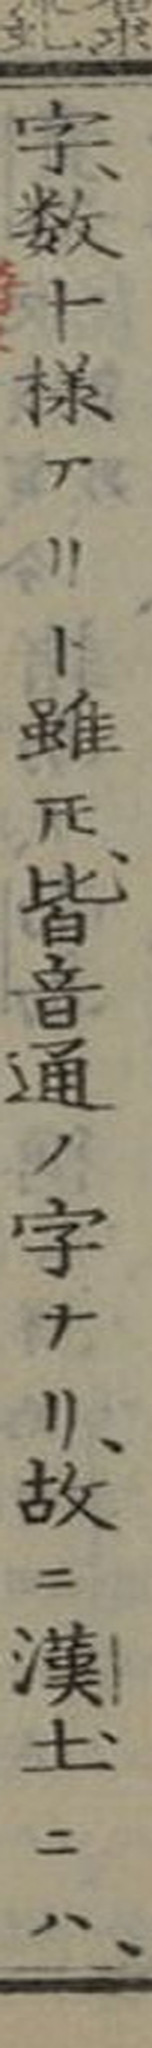字、数十様アリト雖トモ、皆音通ノ字ナリ、故ニ漢土ニハ、
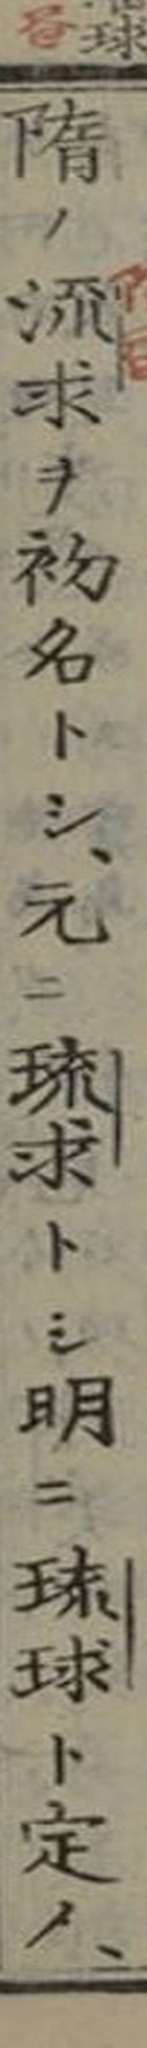隋ノ流求ヲ初名トシ、元ニ琉求トシ明ニ琉球ト定メ、
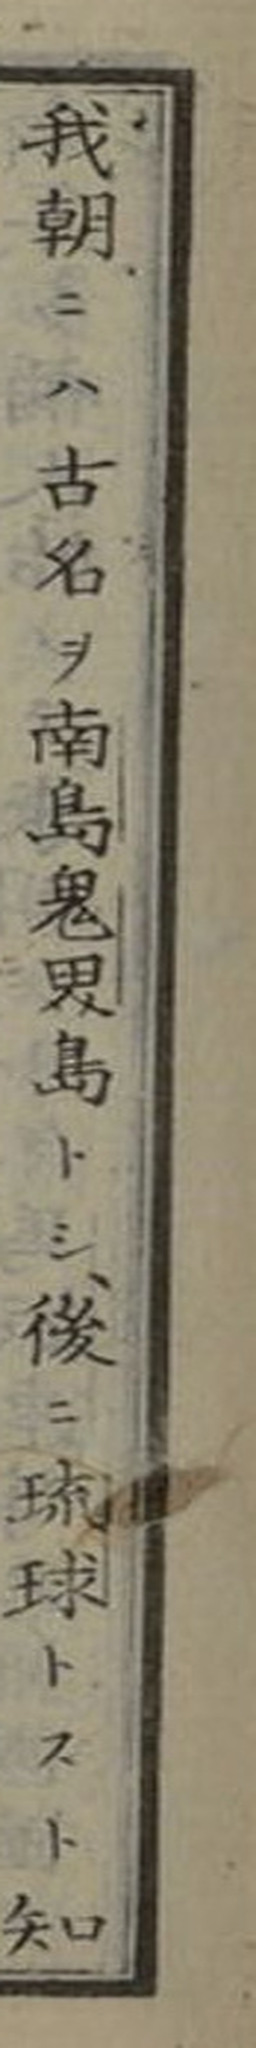我朝ニハ古名ヲ南島鬼界島トシ、後ニ琉球トスト知
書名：琉球新誌 図附 上
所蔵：University of the Ryukyus Library
